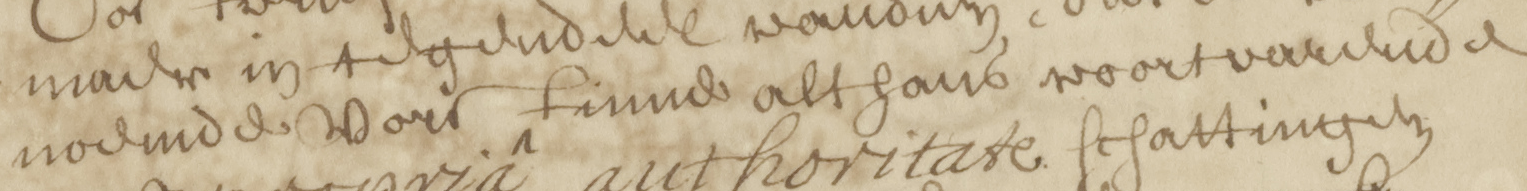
noemde Vorstinne althans voortvarende
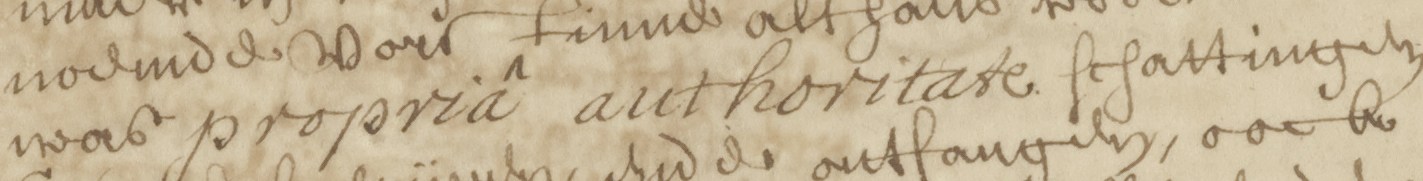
was propriâ authoritate schattingen
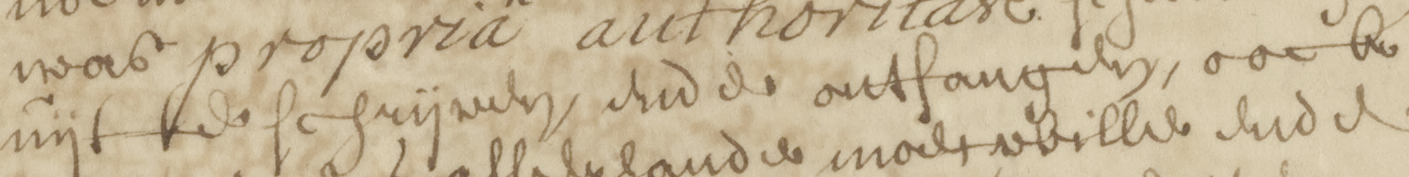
uijt te schrijven, ende ontfangen, oock
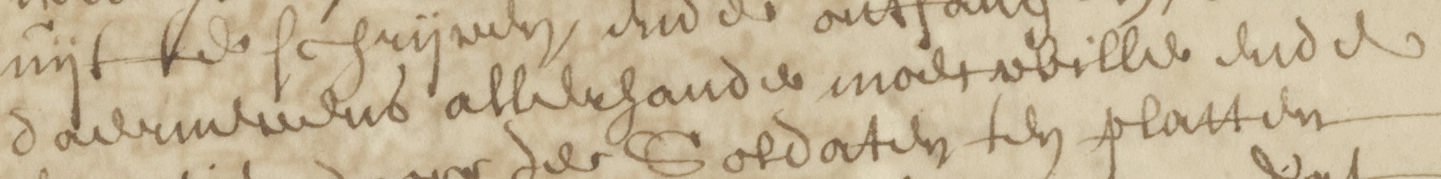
daernevens allerhande moetwille ende
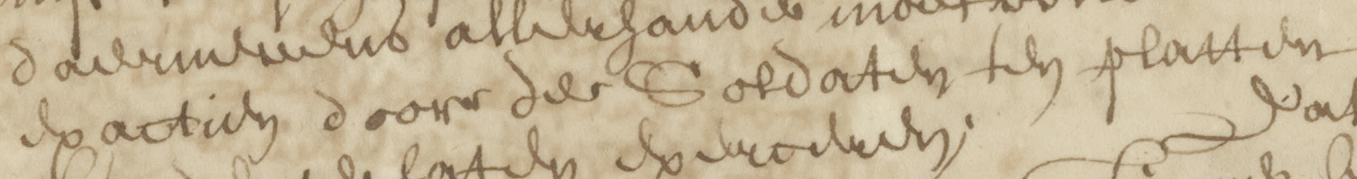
exactien door de Soldaten ten platten
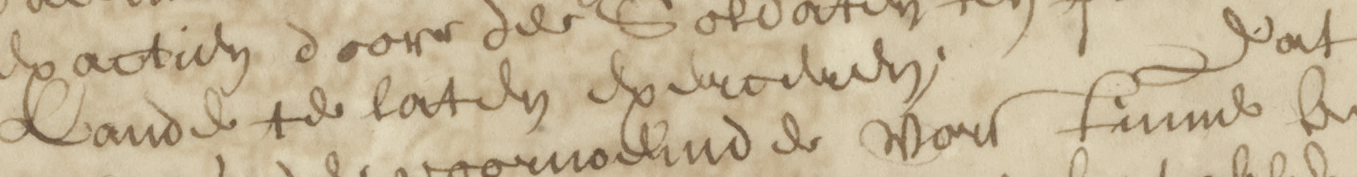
Lande te laten exerceren, dat
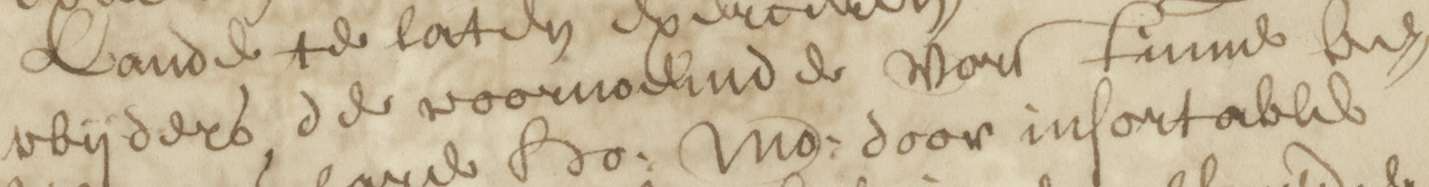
wijders de voornoemde Vorstinne be„
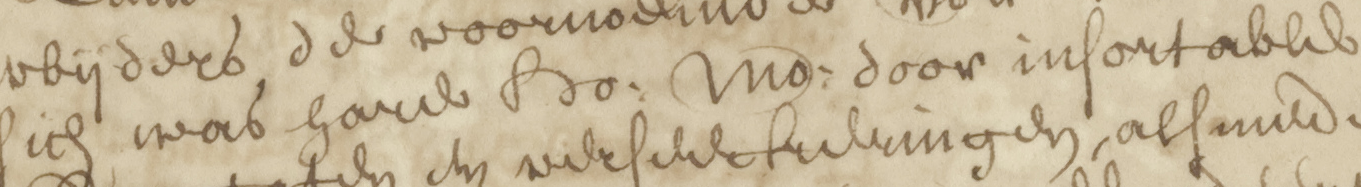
sich was hare Ho:Mo: door infortable
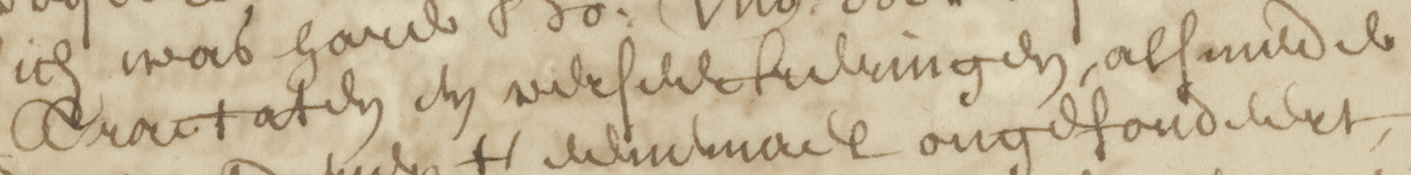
Tractaten en verseeckeringen, alsmede
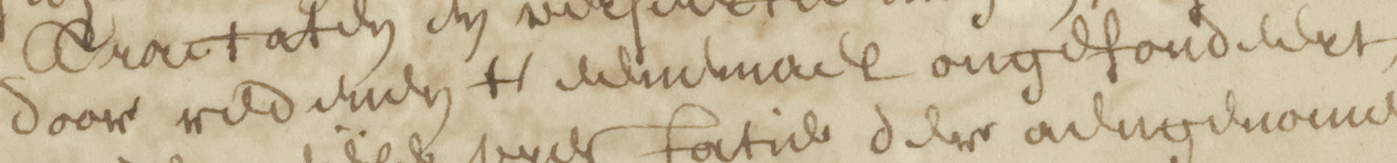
door redenen t‛eenmael ongefondeert,
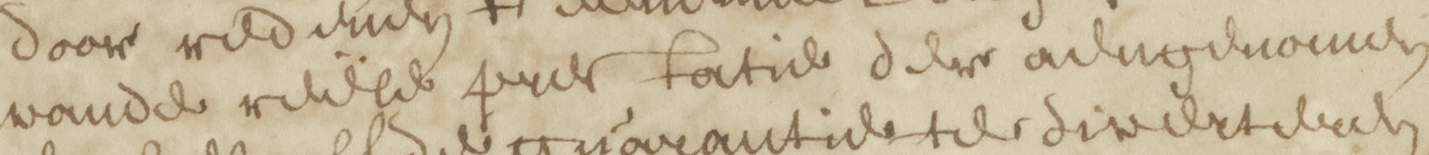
vande reële prestatie der aengenomen
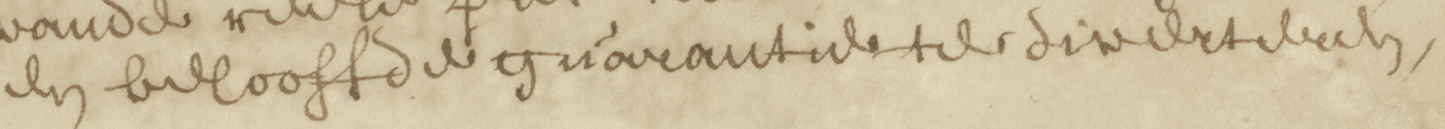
en belooffde guarantie te diverteren,
